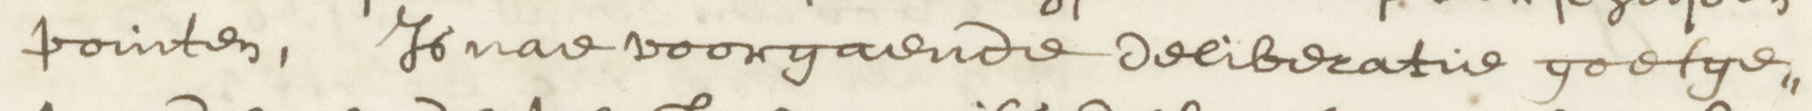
pointen, Is nae voorgaende deliberatie goetge„
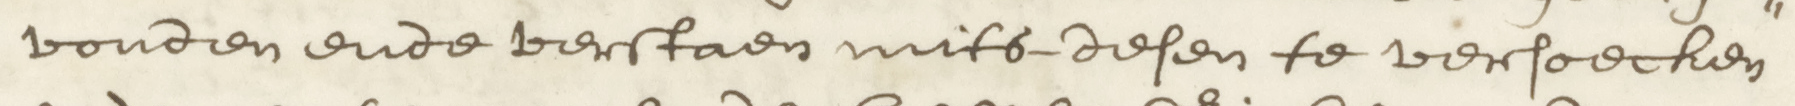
vonden ende verstaen mits desen te versoecken
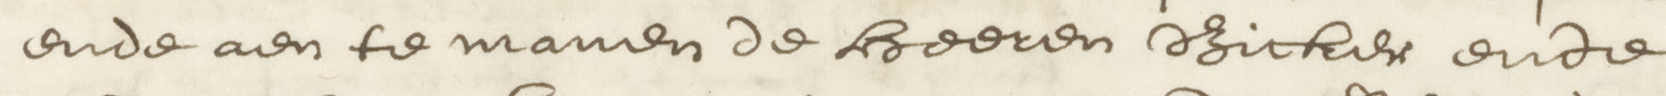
ende aen te manen de heeren Bicker ende
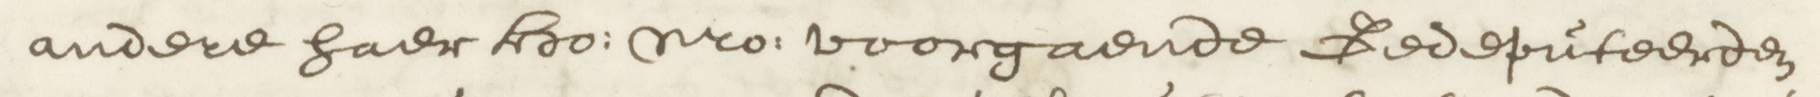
andere haer Ho:Mo: voorgaende Gedeputeerden
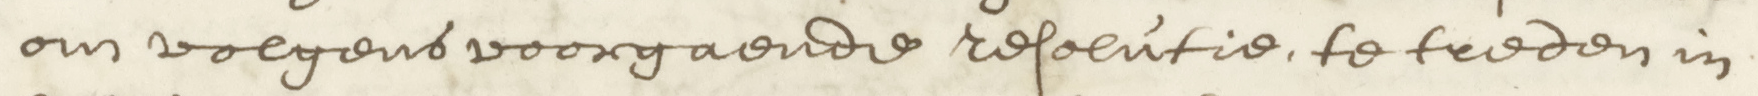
om volgens voorgaende resolutie, te treden in
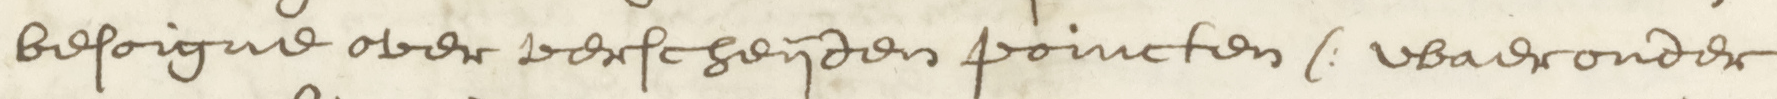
besoigne over verscheijden poincten (:waeronder
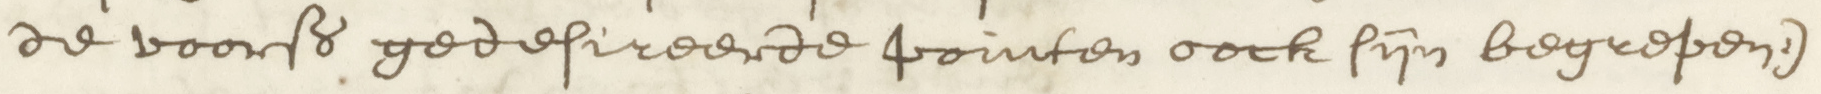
de voors gedesireerde pointen oock sijn begrepen:)
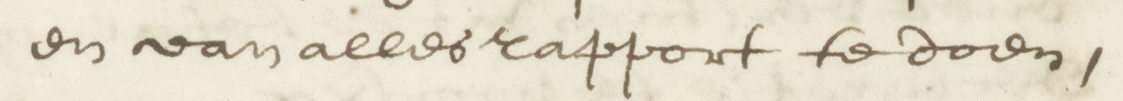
en van alles rapport te doen.
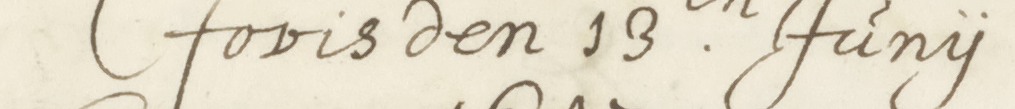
Jovis den 13en. Junij
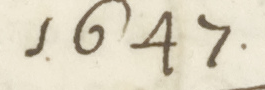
1647.
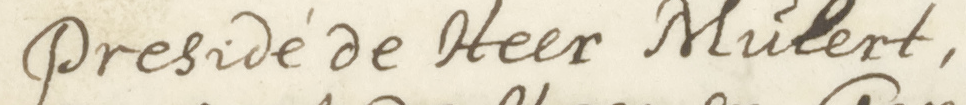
Preside de Heer Mulert,
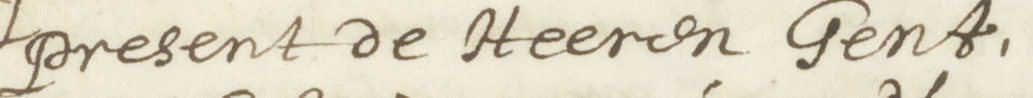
Present de Heeren Gent,
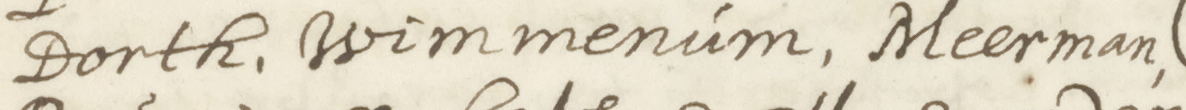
Dorth, Wimmenum, Meerman,
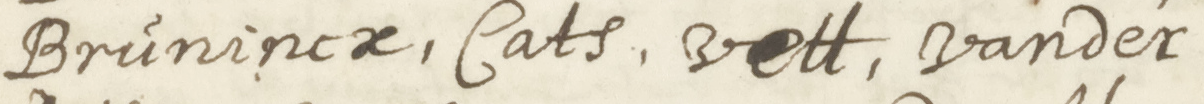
Brunincx, Cats, Vett, vander
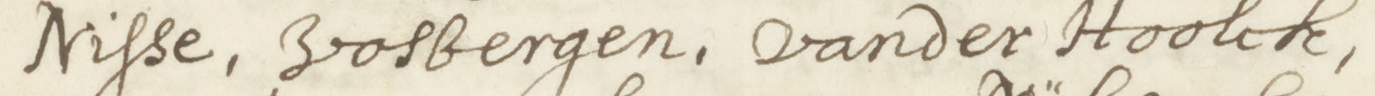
Nisse, Vosbergen, vander Hoolck,
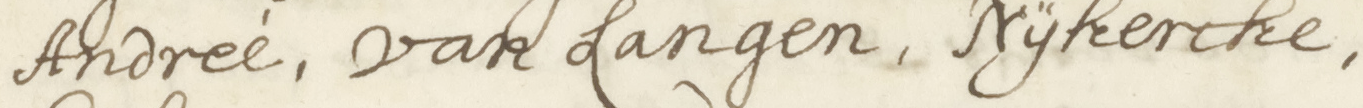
Andreé, van Langen, Nijkercke,
